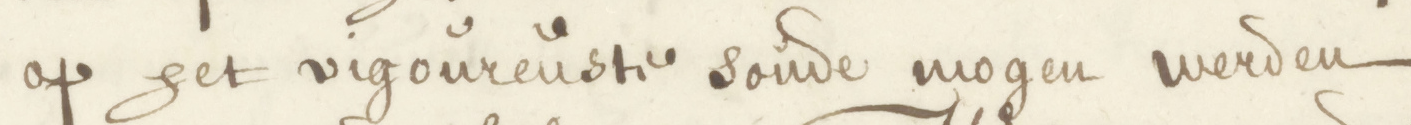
op het vigoureuste soude mogen werden
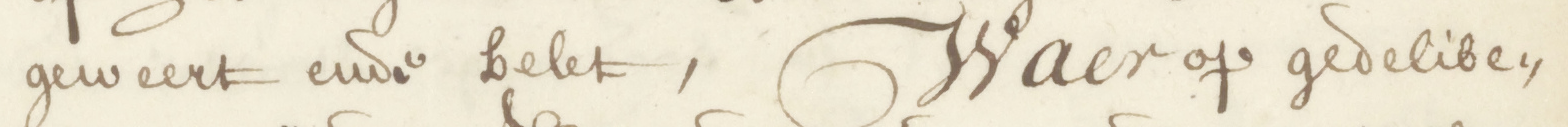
geweert ende belet, Waerop gedelibe„
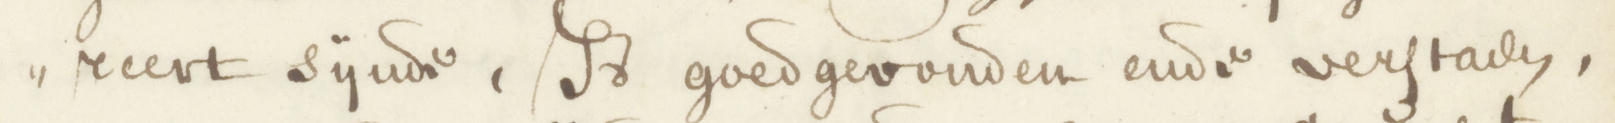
„reert sijnde, Is goedgevonden ende verstaen,
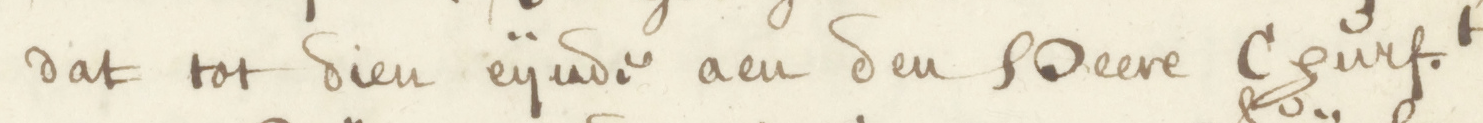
dat tot dien eijnde aen den Heere Churft.
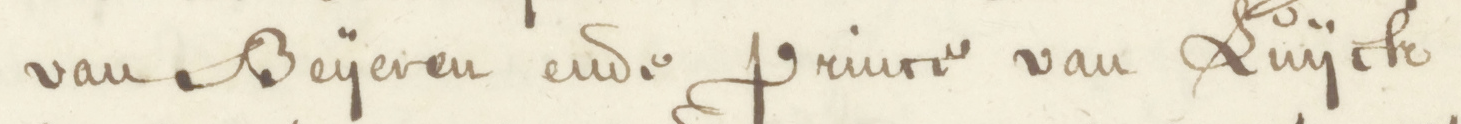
van Beijeren ende Prince van Luijck
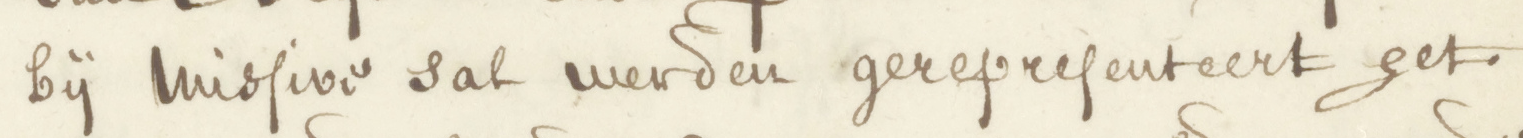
bij Missive sal werden gepresenteert het
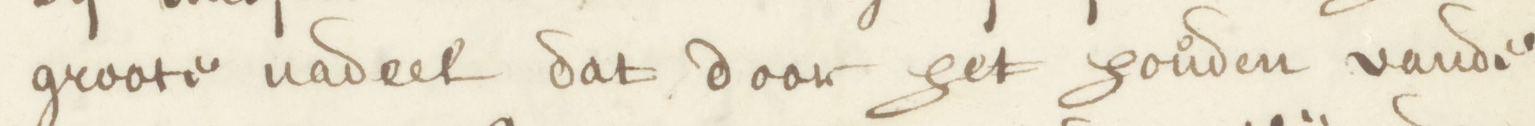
groote nadeel dat door het houden vande
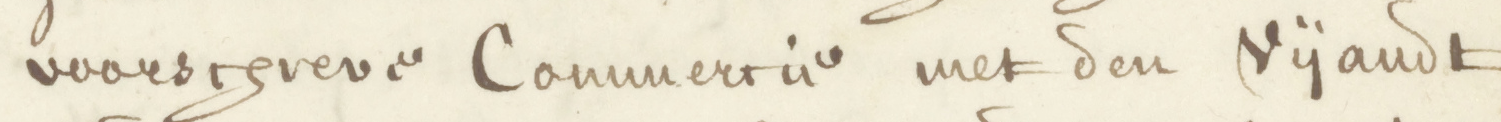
voorschreve Commercie met den Vijandt
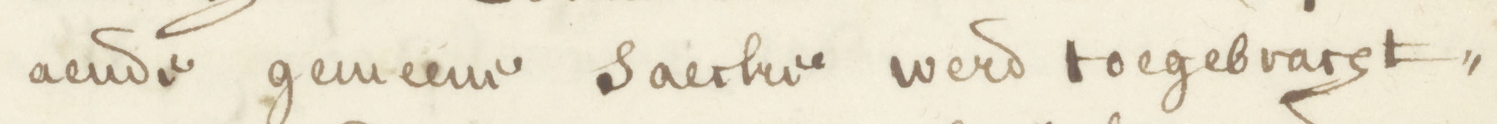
aende gemeene saecke werd toegebracht„
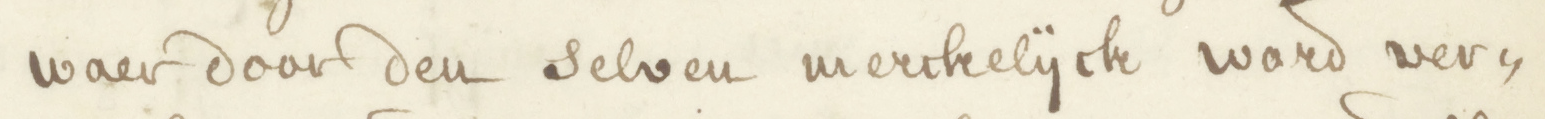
waer door den selven merckelijck word ver„
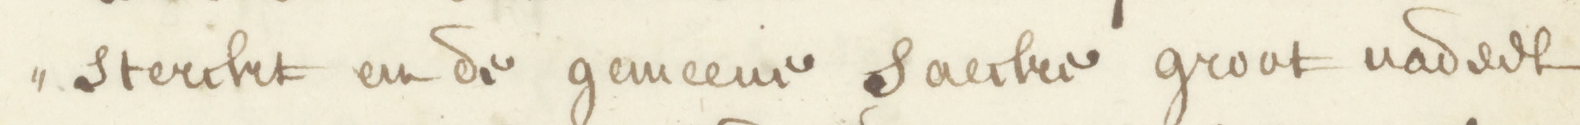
„sterckt ende gemeene saecke groot nadeel
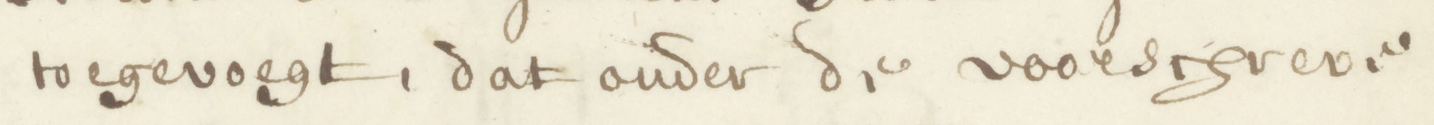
toegevoegt, dat onder de voorschreve
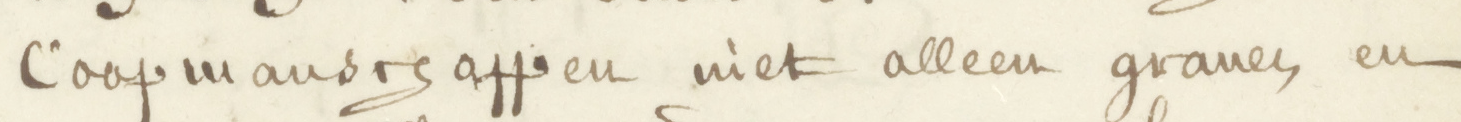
Coopmanschappen niet alleen granen en
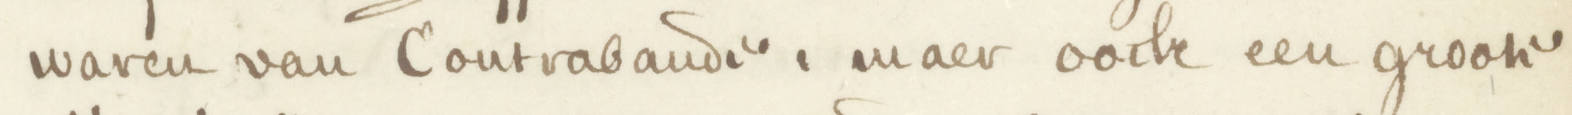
waren van Contrabande, maer oock een groote
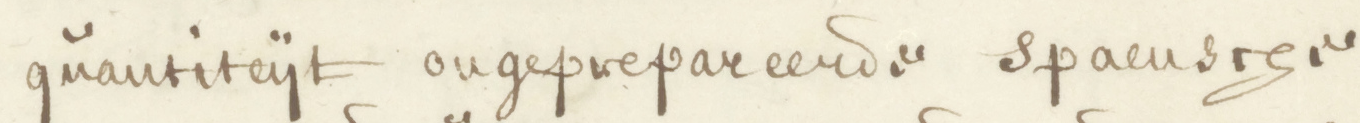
quantiteijt ongeprepareerde spaensche
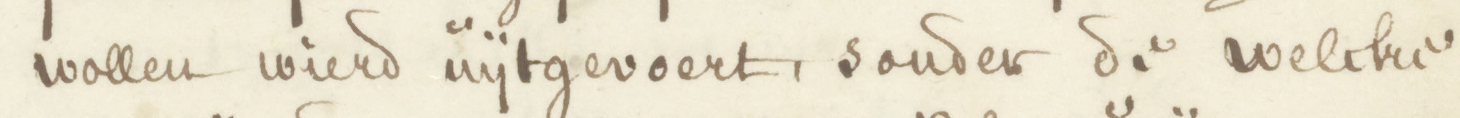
wollen wierd uijtgevoert, sonder de welcke
